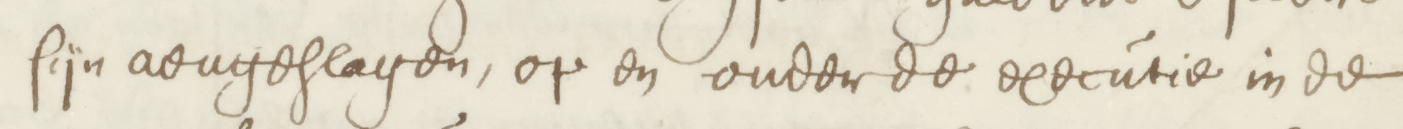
sijn aengeslagen, op en onder de executie in de
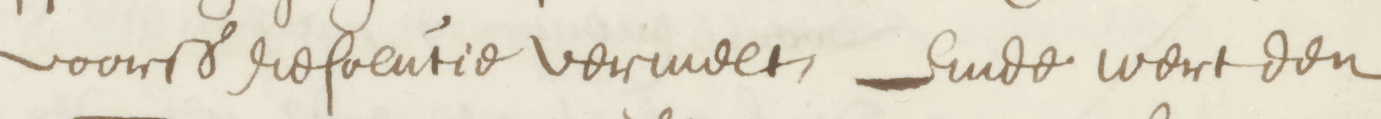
voors resolutie vermelt. Ende wert den
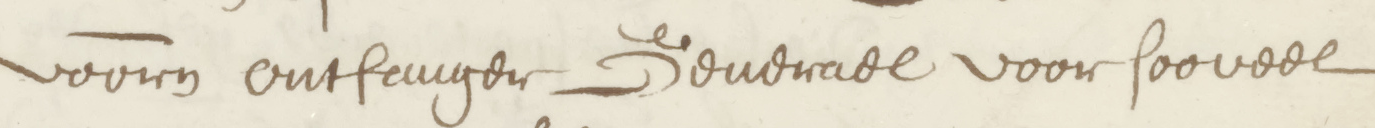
voorn ontfanger Generael voor sooveel
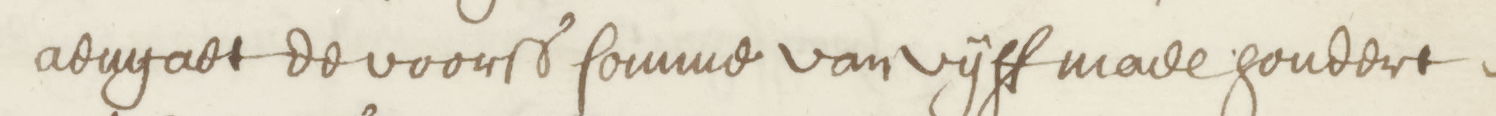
aengaet de voors somme van vijffmael hondert
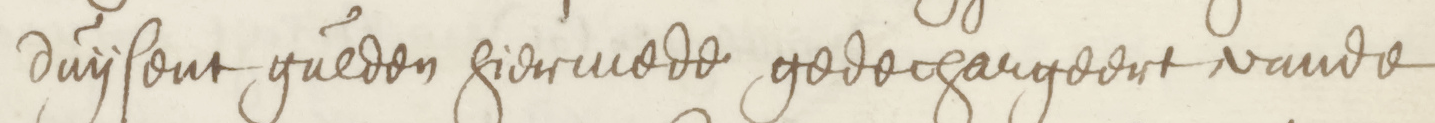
duijsent gulden hiermede gedechargeert vande
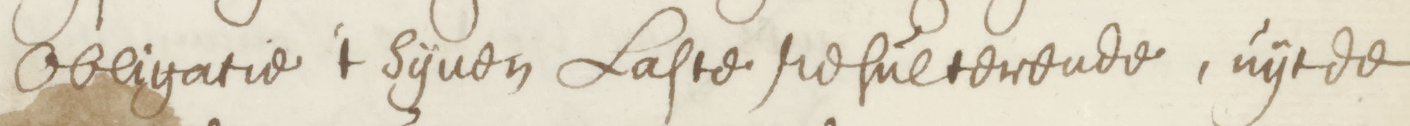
Obligatie 't sijnen Laste resulterende, uijt de
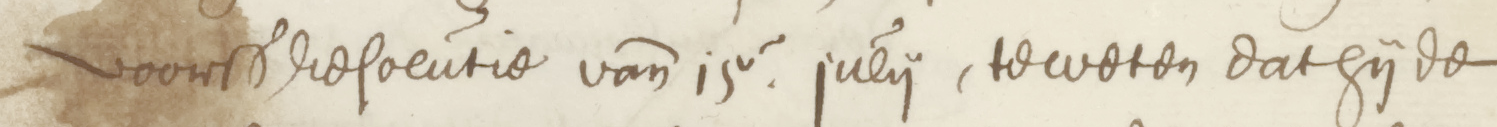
voors resolutie van 15e. julij, te weten dat hij de
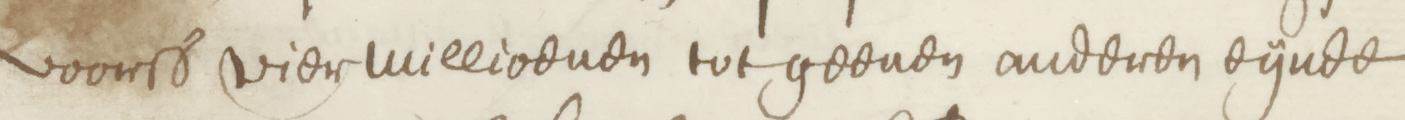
voors vier millioenen tot geenen anderen eijnde
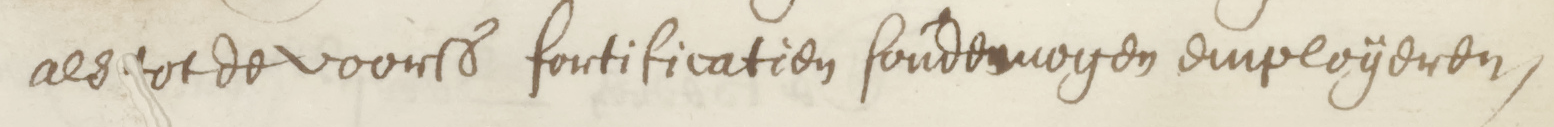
als tot de voors fortificatien soude mogen emploijeren.
